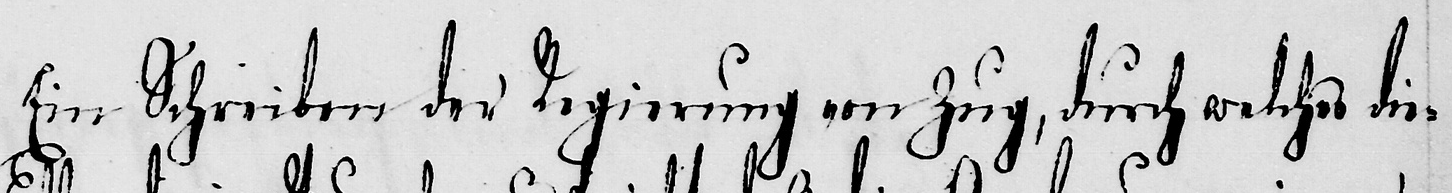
Ein Schreiben der Regierung von Zug, durch welches di¬
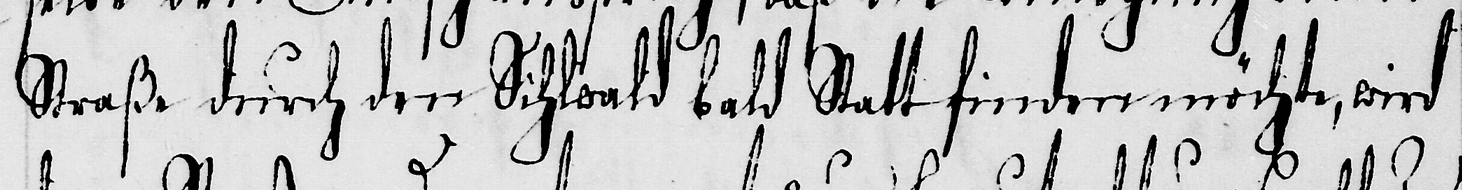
Straße durch den Sihlwald bald Statt finden möchte, wird
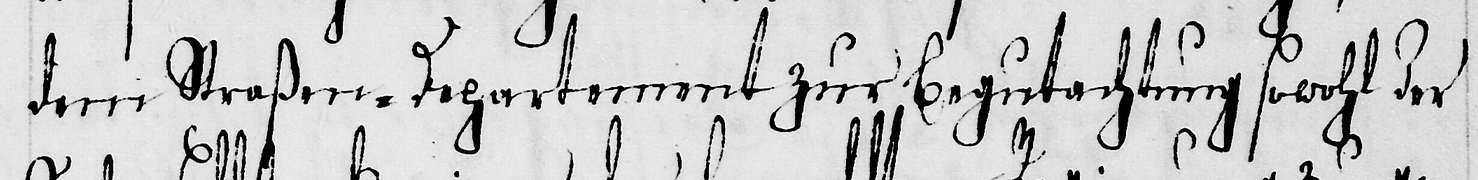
dem Straßen-Departement zur Begutachtung sowohl der
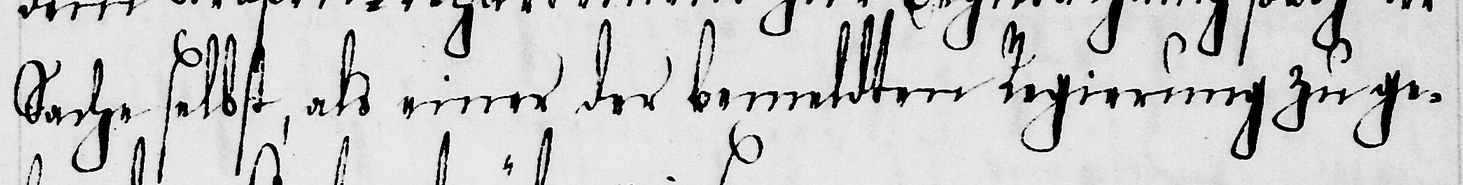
Sache selbst, als einer der bemeldten Regierung zu ge¬
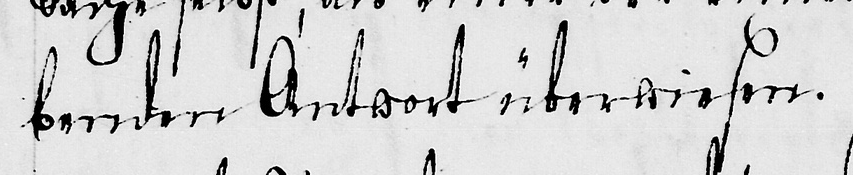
benden Antwort überwiesen.
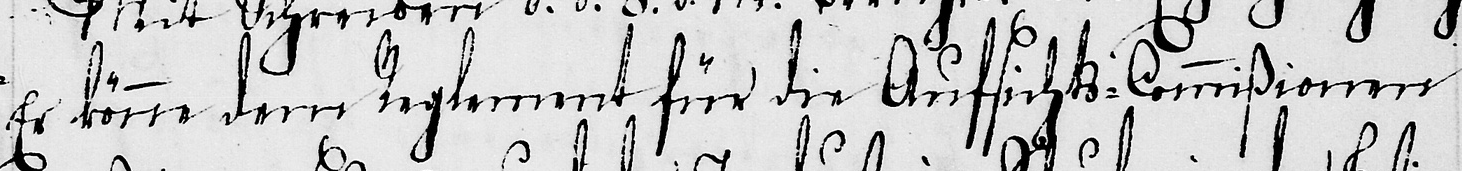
Er könne dem Reglement für die Aufsichts-Commißionen
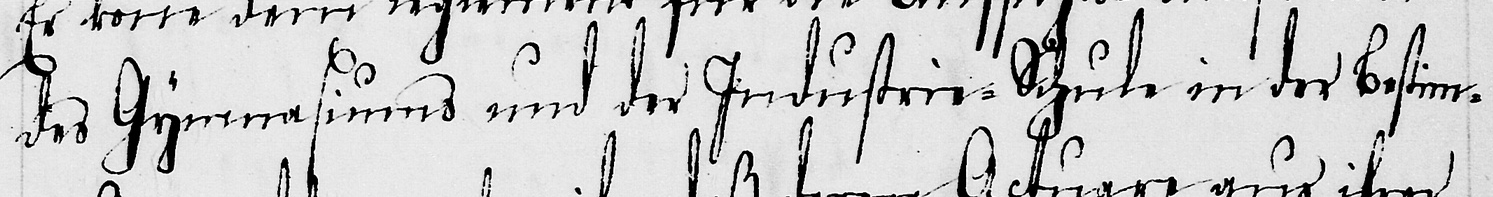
des Gymnasiums und der Industrie-Schule in der Bestim¬
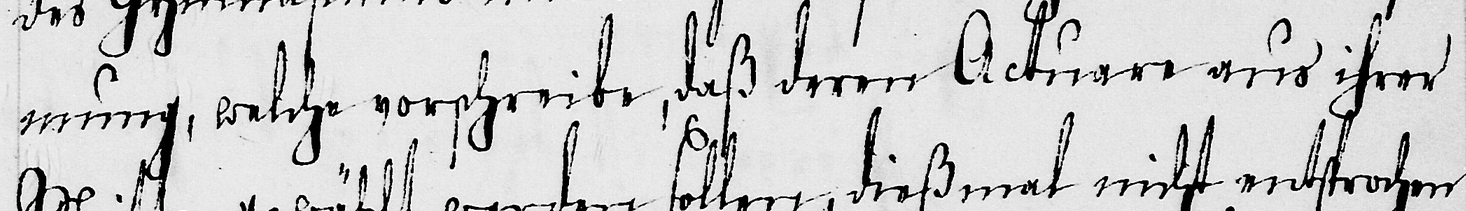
mung, welche vorschreibe, daß deren Actuare aus ihrer
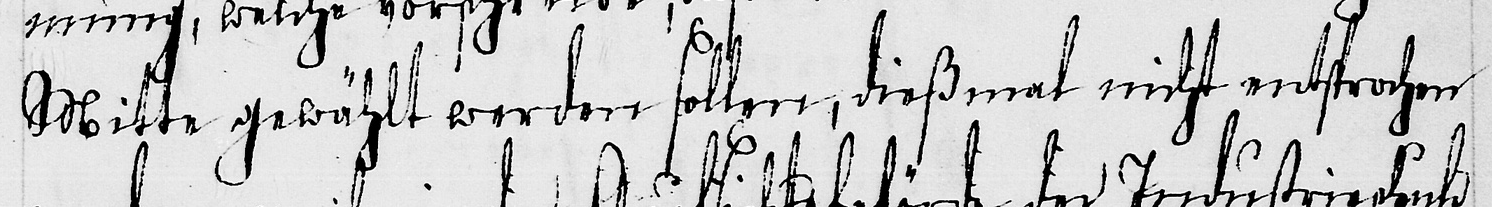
Mitte gewählt werden sollen, dießmal nicht entsprochen
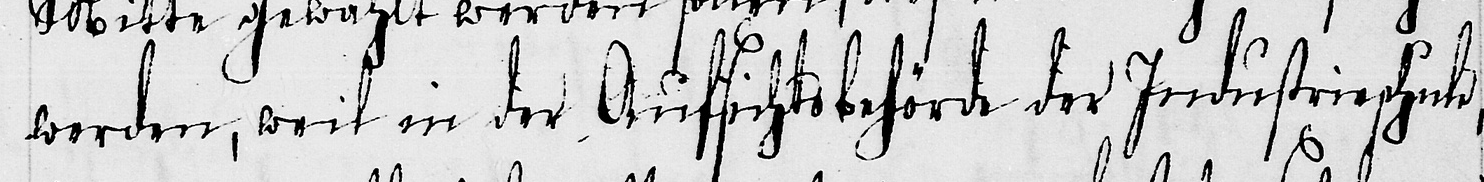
werden, weil in der Aufsichtsbehörde der Industrieschul¬
